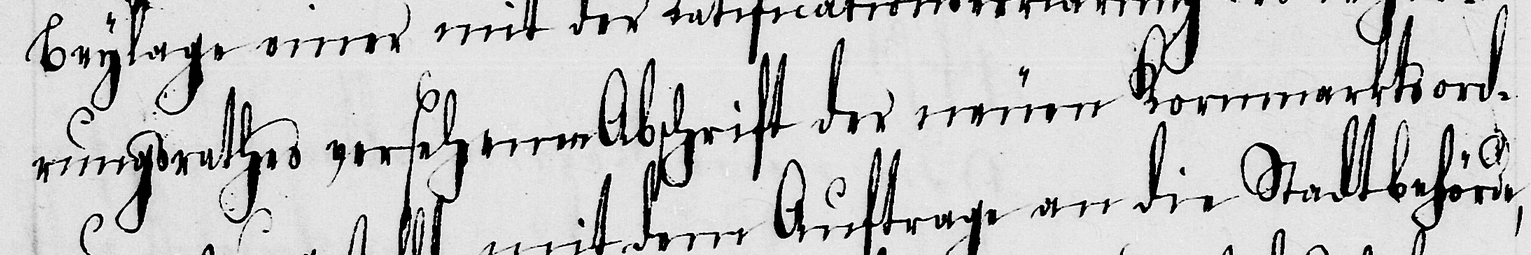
rungsrathes versehenen Abschrift der neuen Kornmarktsord¬
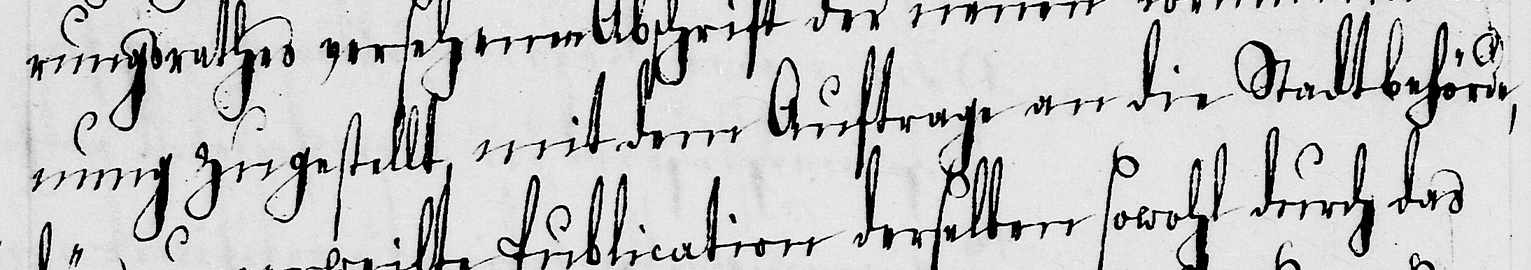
nung zugestellt, mit dem Auftrage an die Stadtbehörde,
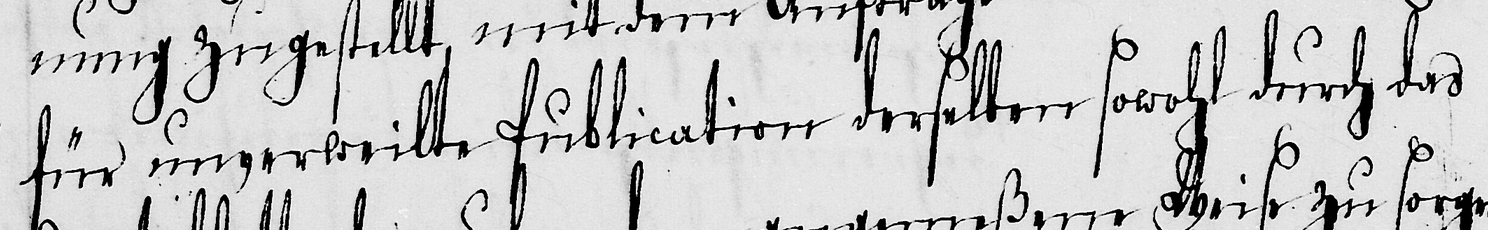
für unverweilte Publication derselben sowohl durch das
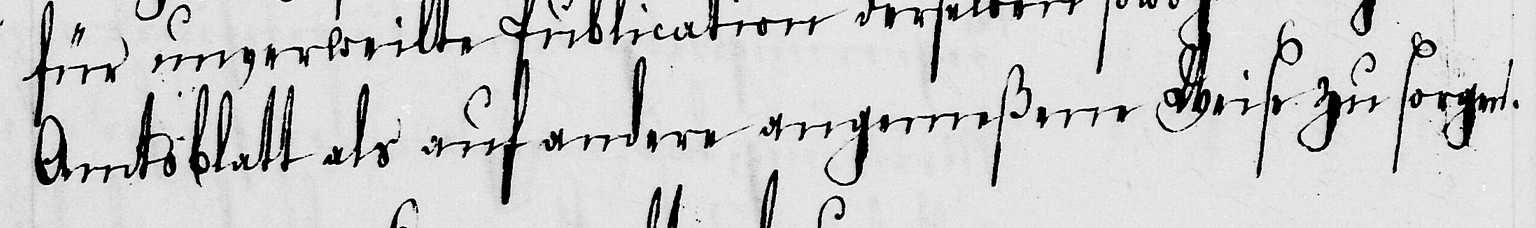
Amtsblatt als auf andere angemeßene Weis zu sorgen.
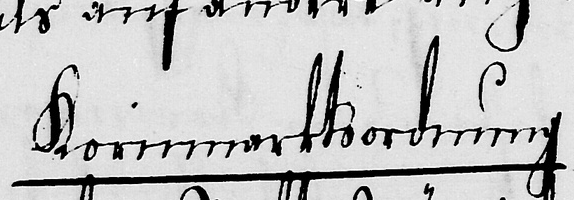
Kornmarktsordnung
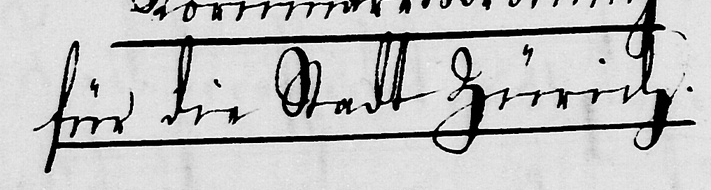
für die Stadt Zürich.
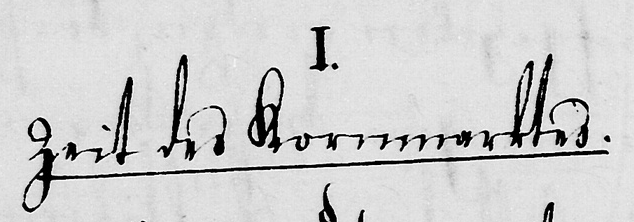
Zeit des Kornmarktes.
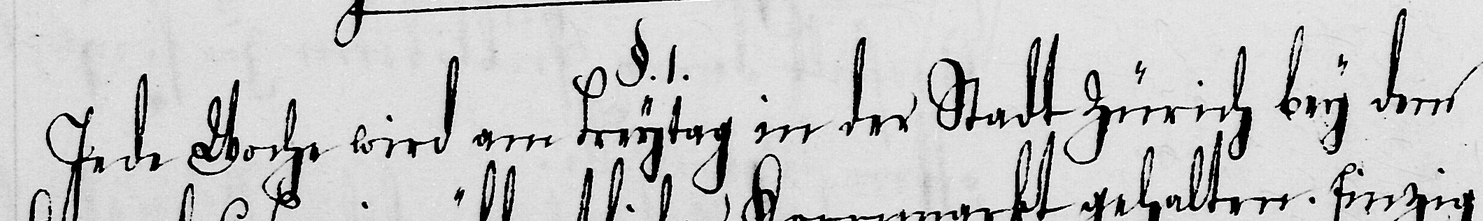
Jede Woche wird am Freytag in der Stadt Zürich bey dem
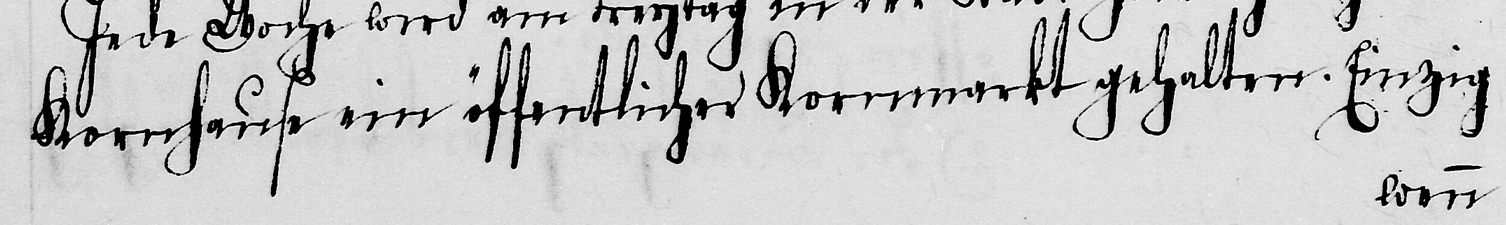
Kornhause ein öffentlicher Kornmarkt gehalten. Einzig
